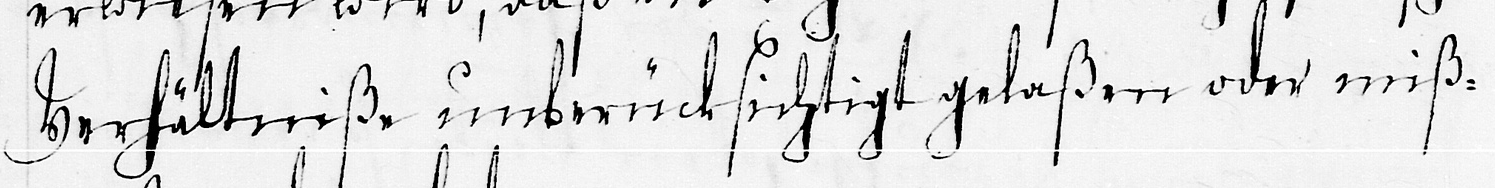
Verhältniße unberücksichtigt gelaßen oder miß¬
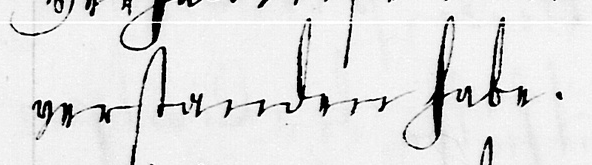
verstanden habe.
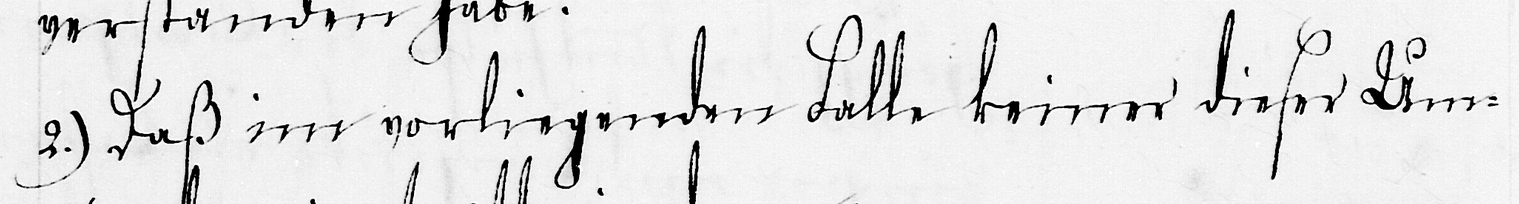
2.) Daß im vorliegenden Falle keiner dieser Um¬
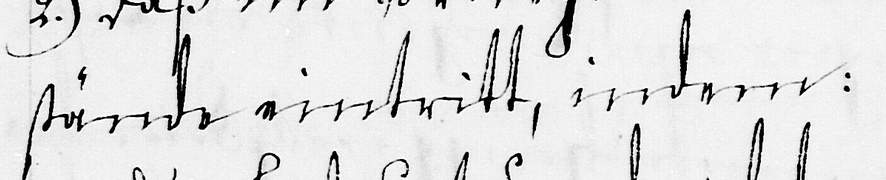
stände eintritt, indem:
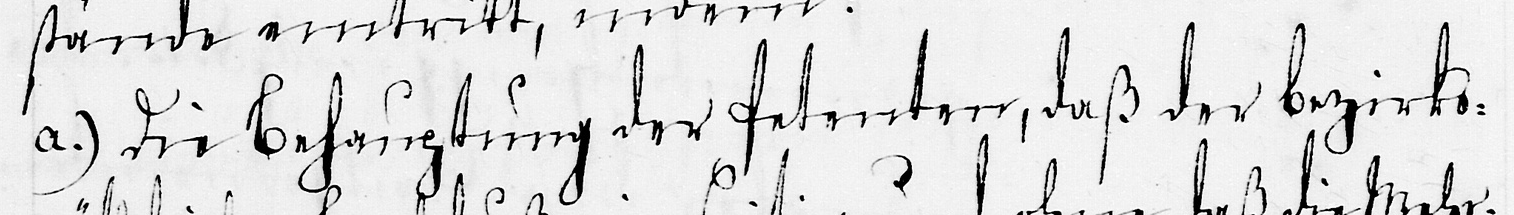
a.) Die Behauptung der Petenten, daß der bezirks¬
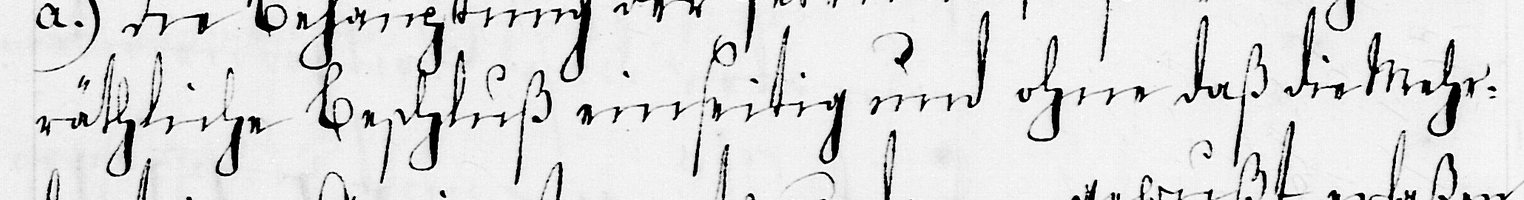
räthliche Beschluß einseitig und ohne daß die Mehr¬
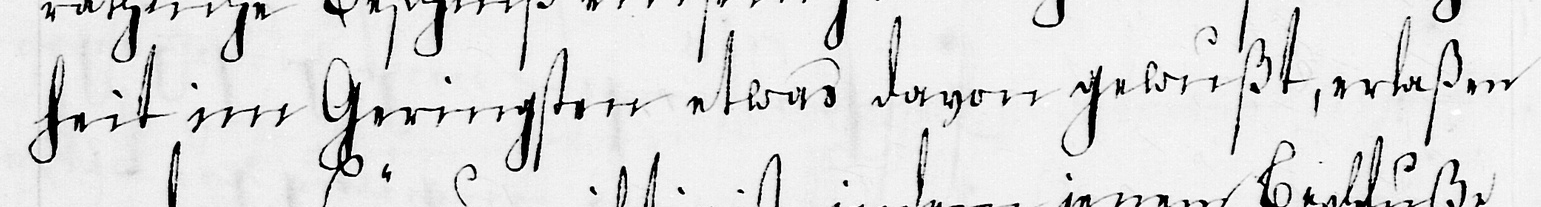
heit im Geringsten etwas davon gewußt, erlaßen
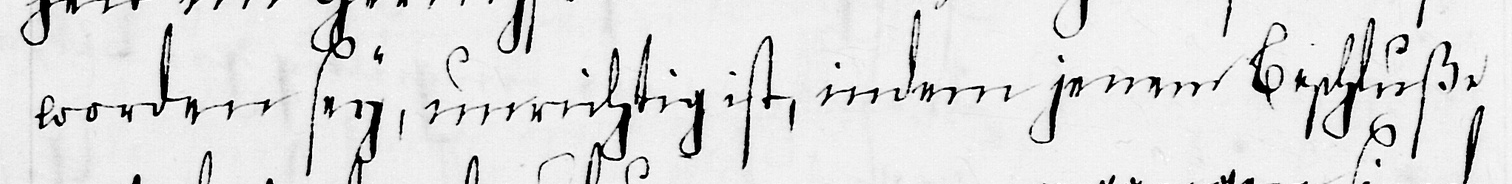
worden sey, unrichtig ist, indem jenem Beschluße
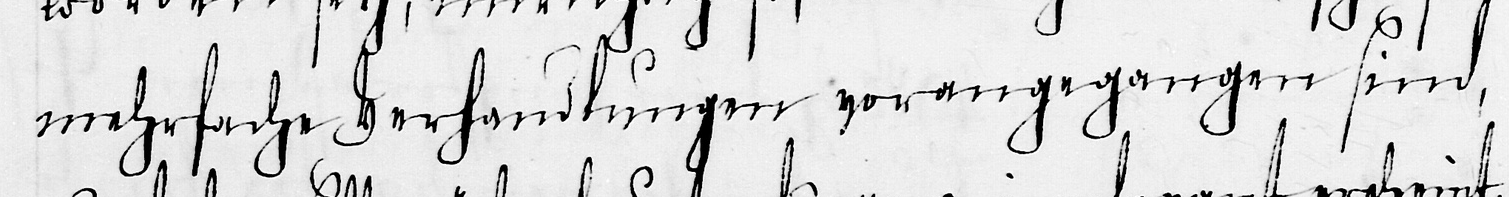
mehrfache Verhandlungen vorangegangen sind,
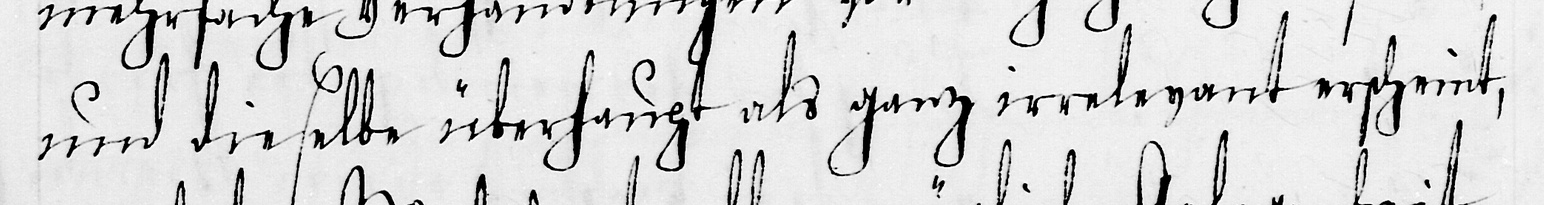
und dieselbe überhaupt als ganz irrelevant erscheint,
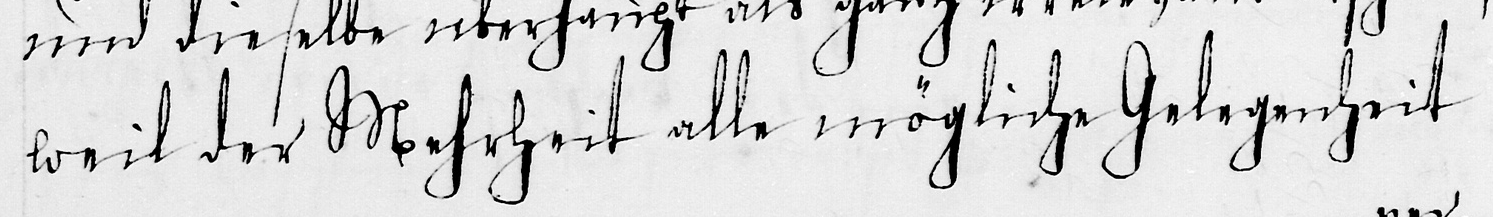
weil der Mehrheit alle mögliche Gelegenheit
